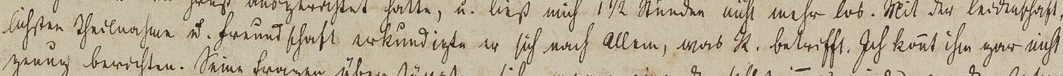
lichsten Theilnahme u. Freundschaft erkundigte er sich nach Allem, was K. betrifft. Ich konnt ihm gar nicht
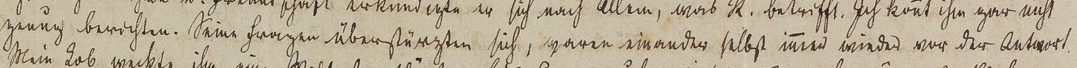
genug berichten. Seine Fragen überstürzten sich, waren einander selbst immer wieder vor der Antwort.
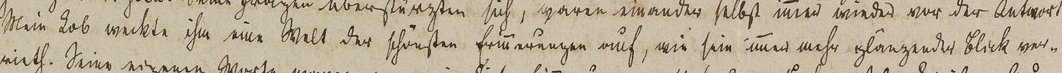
Mein Lob weckte ihm eine Welt der schönsten Erinnerungen auf, wie sein immer mehr glänzender Blick ver-
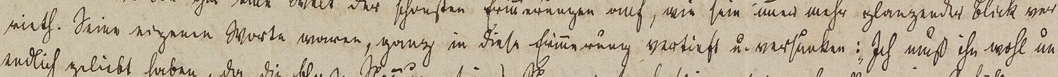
rieth. Seine eigenen Worte waren, ganz in diese Erinnerung vertieft u. versunken: «Ich muß ihn wohl un-
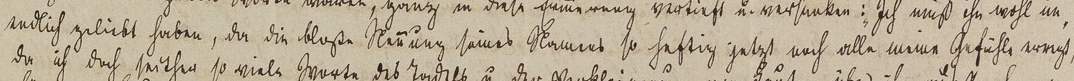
endlich geliebt haben, da die bloße Nennung seines Namens so heftig jetzt noch alle meine Gefühle erregt,
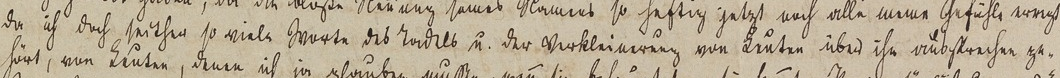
da ich doch seither so viele Worte des Tadels u. der Verkleinerung von Leuten über ihn aussprechen ge-
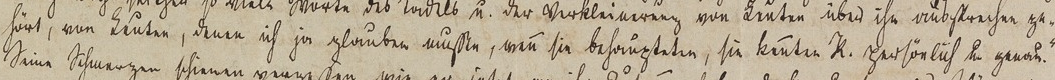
hört, von Leuten, denen ich ja glauben mußte, wenn sie behaupteten, sie kennten K. persönlich u. genau.»
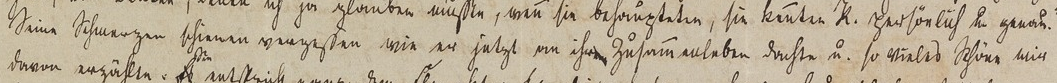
Seine Schmerzen schienen vergessen wie er jetzt an ihrem Zusammenleben dachte u. so vieles Schöne mir
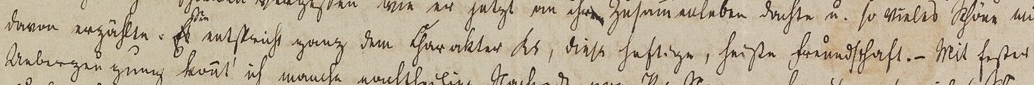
davon erzählte. EsSie entspricht ganz dem Charakter Rs, diese heftige, heiße Freundschaft. – Mit fester
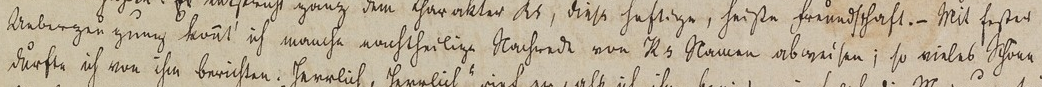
Ueberzeugung konnt' ich manche nachtheilige Nachrede von Ks Namen abweisen; so vieles Schöne
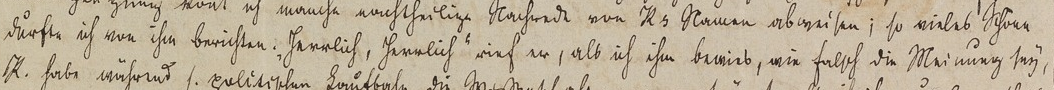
durfte ich von ihm berichten. «Herrlich, Herrlich» rief er, als ich ihm bewies, wie falsch die Meinung sey,
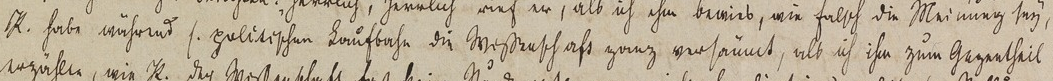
K. habe während s. politischen Laufbahn die Wissenschaft ganz versäumt, als ich ihm zum Gegentheil
